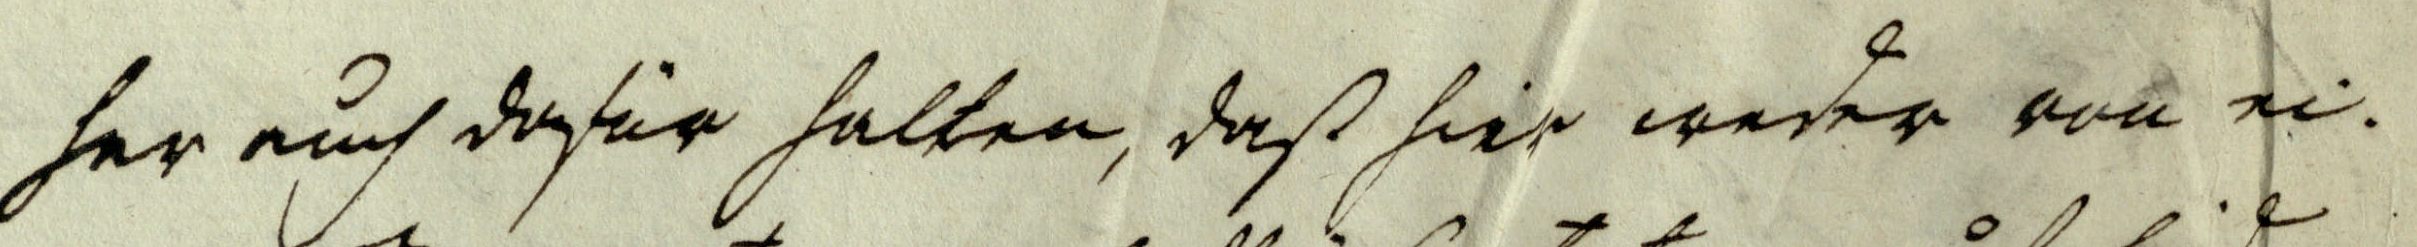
her auch dafür halten, daß hier weder von ei¬
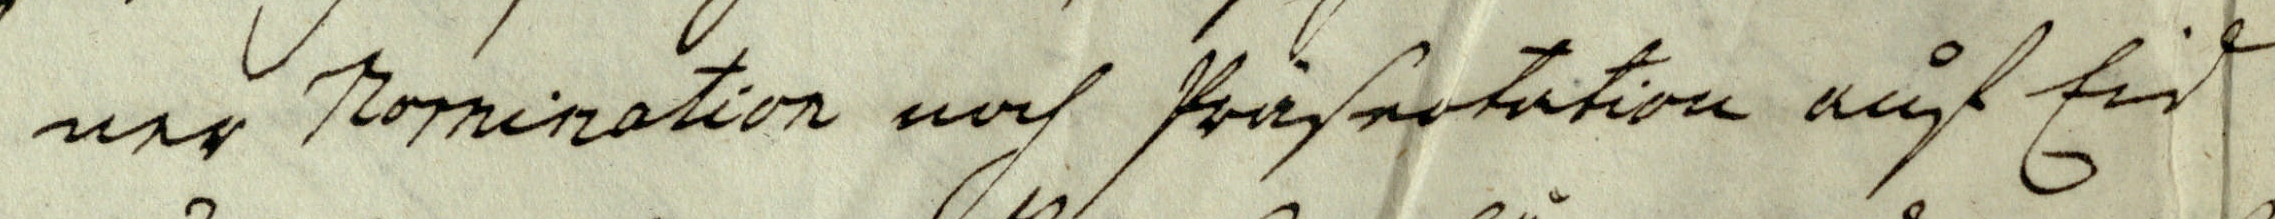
ner Nomination noch Präsentation auf Eid
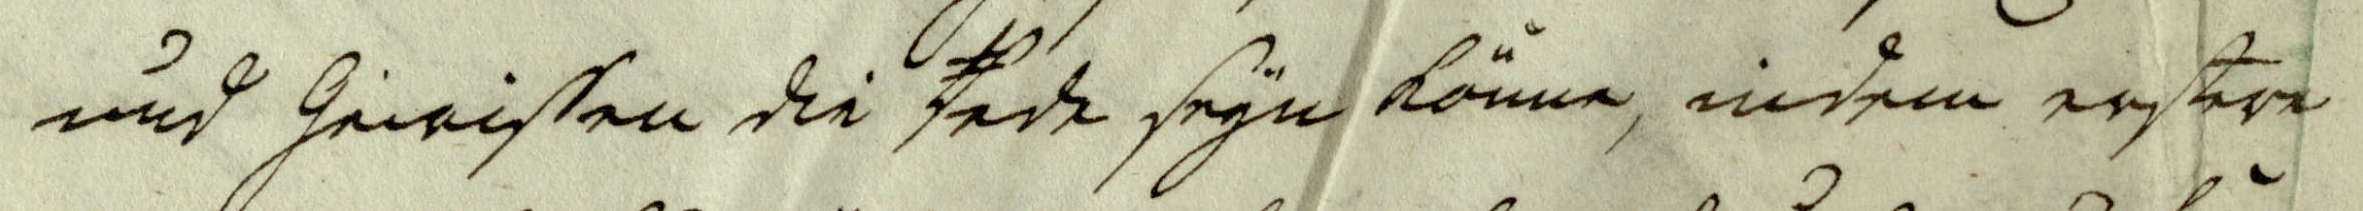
und Gewissen die Rede seÿn könne, indem erstere
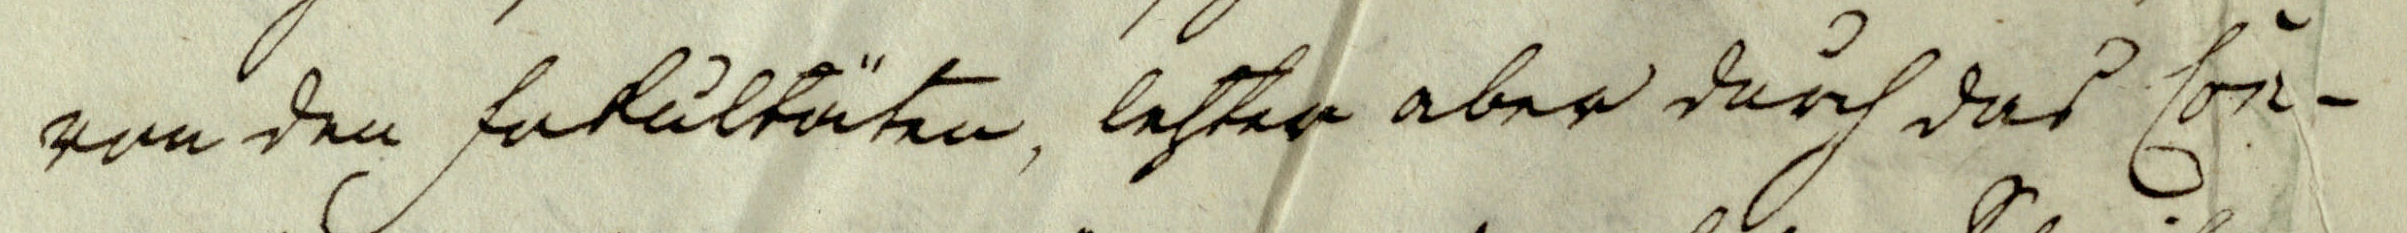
von den Fakultäten, letzter aber durch das Con¬
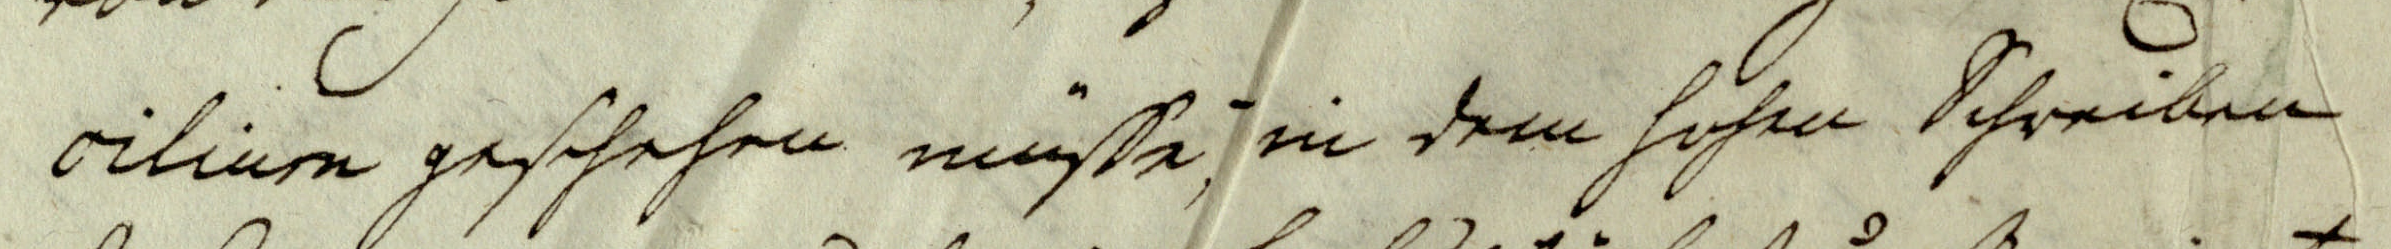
cilium geschehen müsse, in dem hohen Schreiben
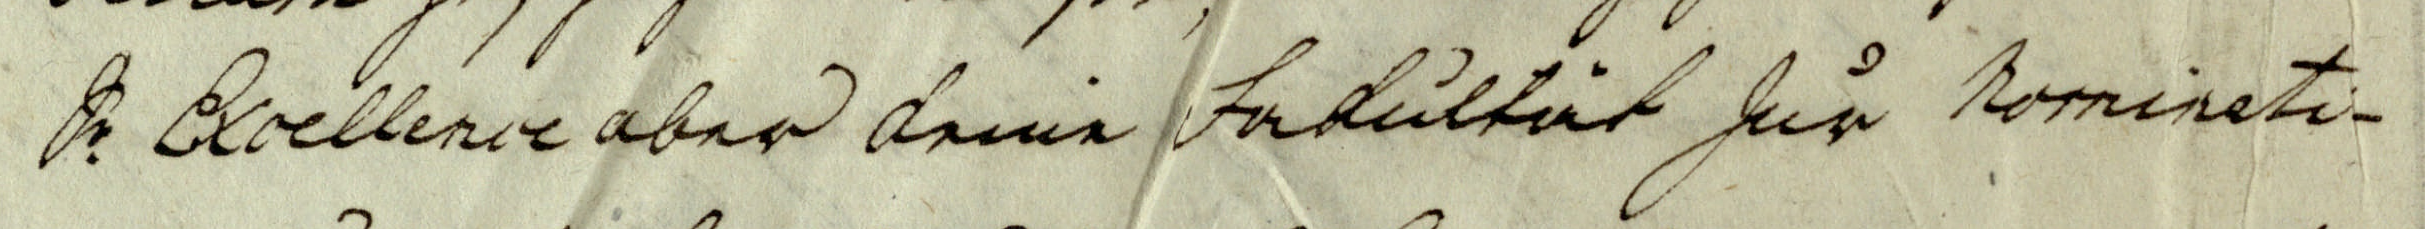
Sr. Excellence aber keine Fakultät zur Nominati¬
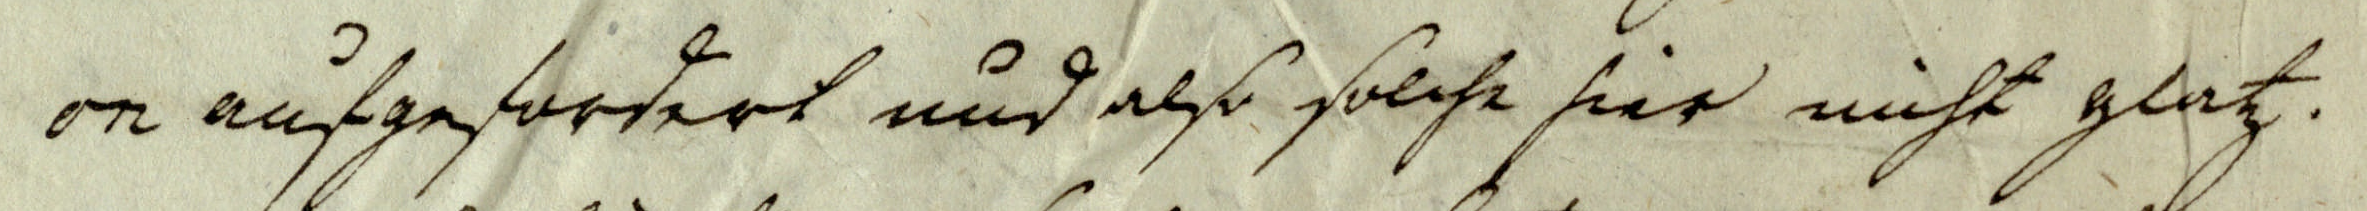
on aufgefordert und also solche hier nicht platz¬
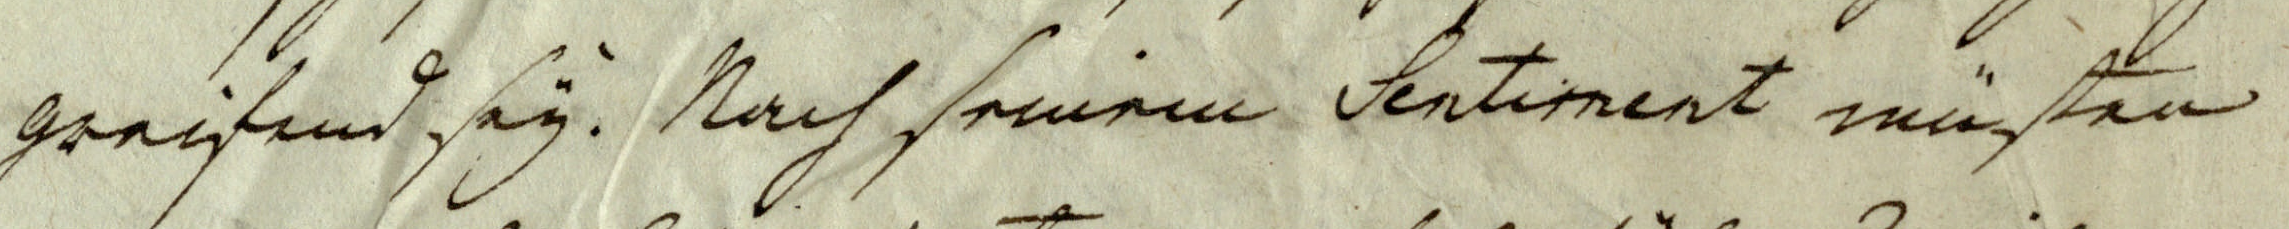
greifend seÿ. Nach seinem Sentiment müssten
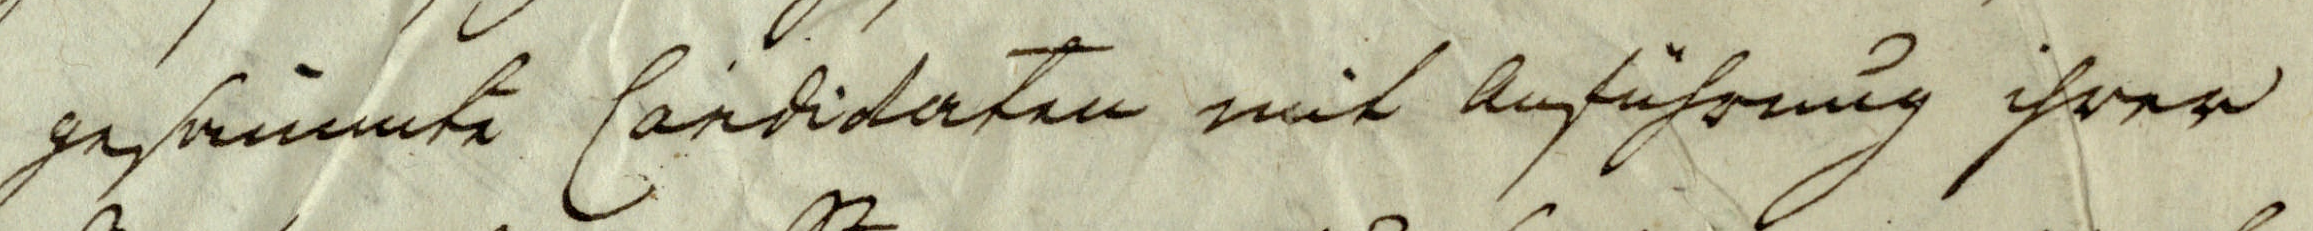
gesammte Candidaten mit Anführung ihrer
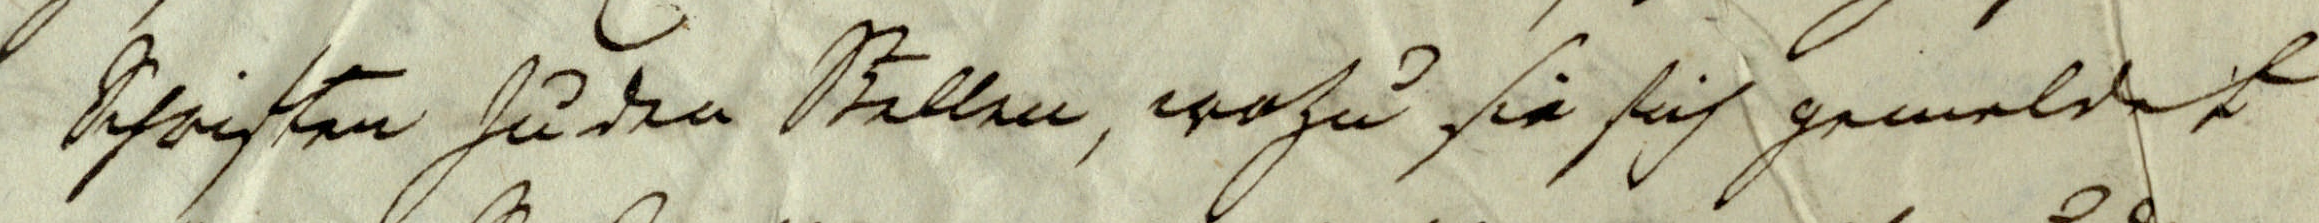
Schriften zu den Stellen, wozu sie sich gemeldet
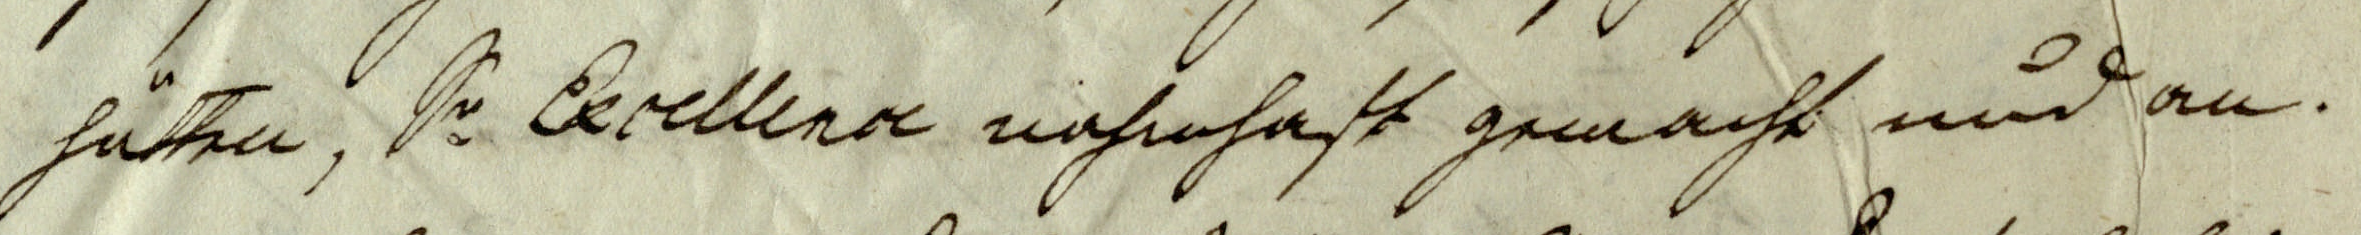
hätten, Sr. Excellence nahmhaft gemacht und an¬
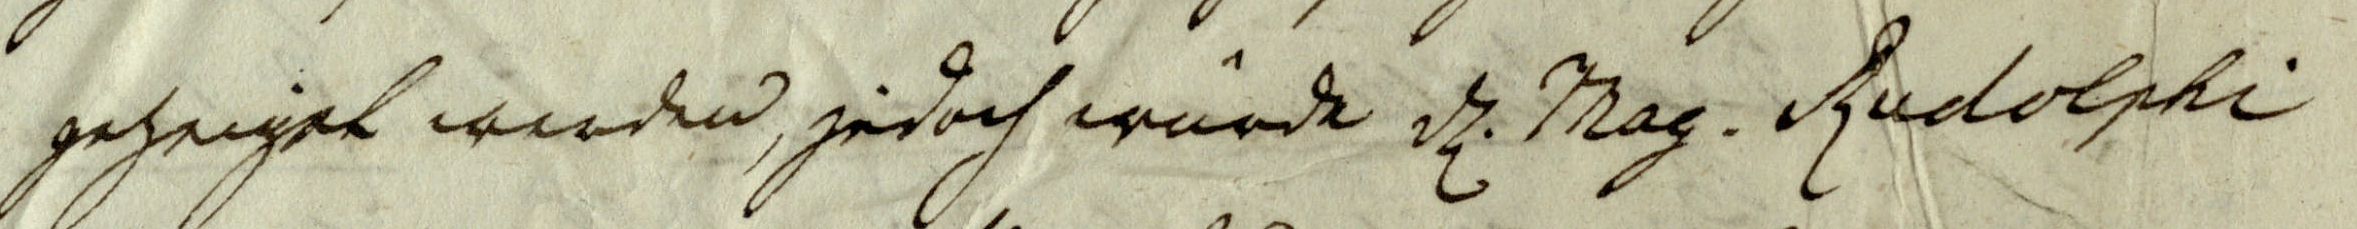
gezeiget werden, jedoch würde dh. Mag. Rudolphi
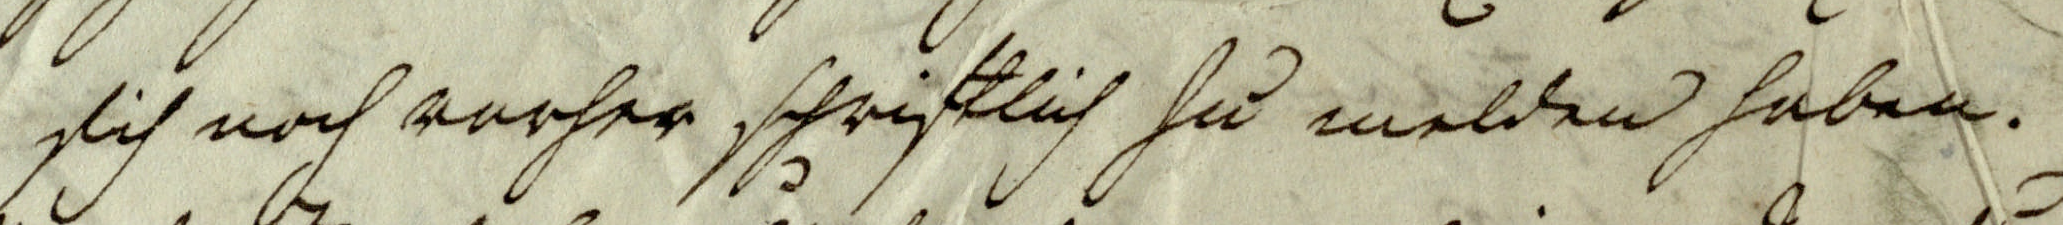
sich noch vorher schriftlich zu melden haben.
